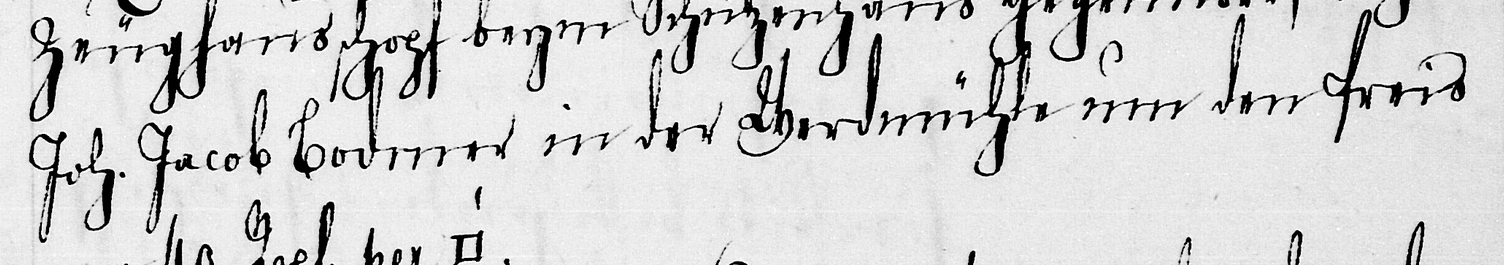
Joh. Jacob Bodmer in der Werdmühle um den Preis
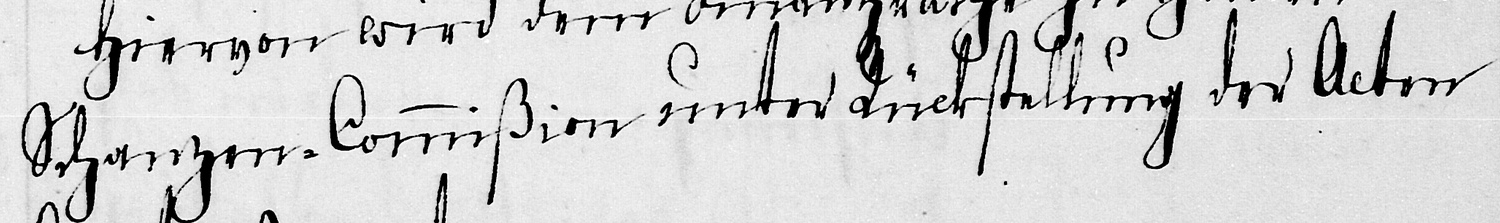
Schanzen-Commißion unter Rückstellung der Acten
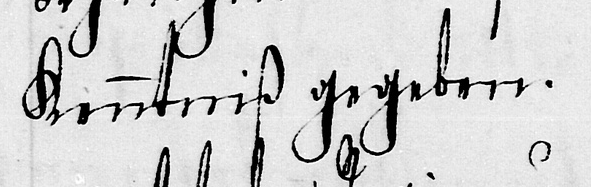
Kenntniß gegeben.
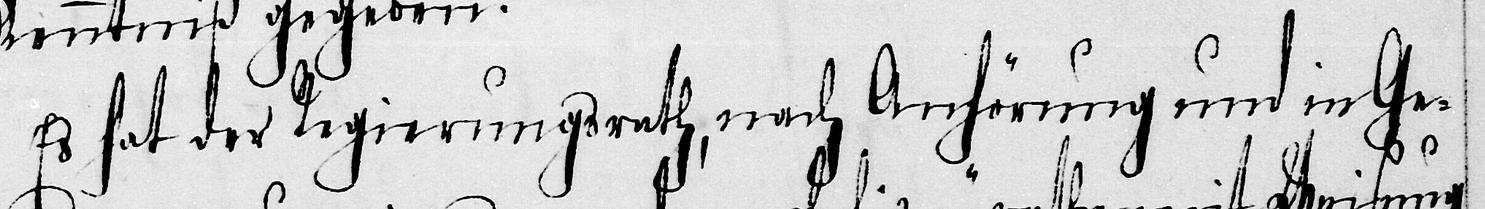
Es hat der Regierungsrath, nach Anhörung und in Ge¬
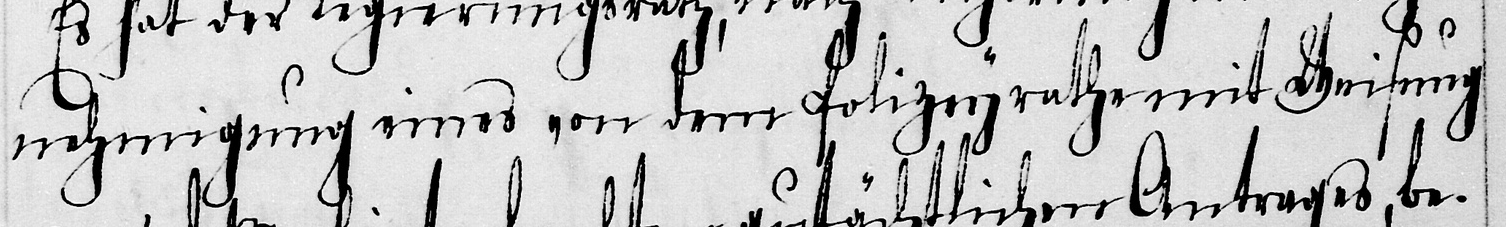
nehmigung eines von dem Polizeyrathe mit Weisung
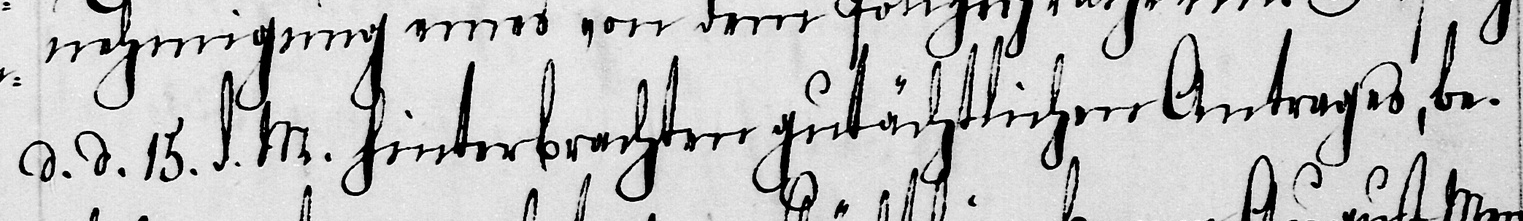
d. 15. d. M. hinterbrachten gutächtlichen Antrages, be¬
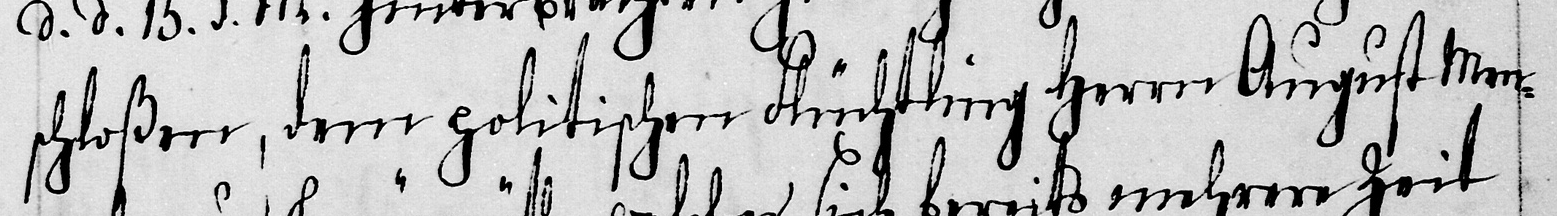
schloßen, dem politischen Flüchtling Herrn August Men¬
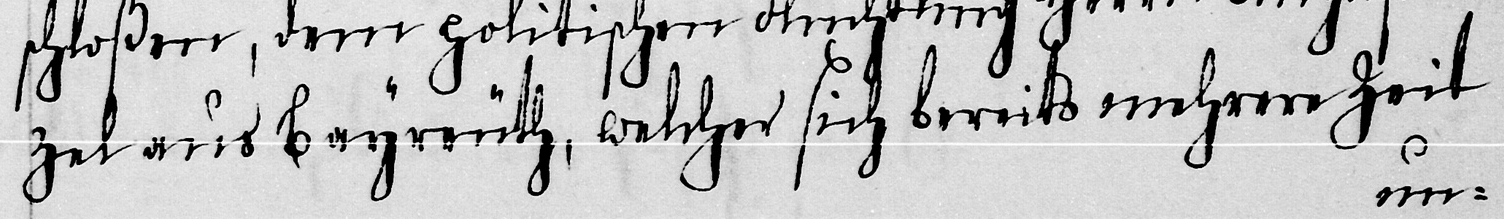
zel aus Bayreuth, welcher sich bereits mehrere Zeit
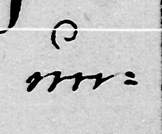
an
